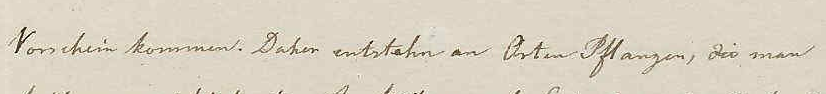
Vorschein kommen. Daher entstehn an Orten Pflanzen, die man
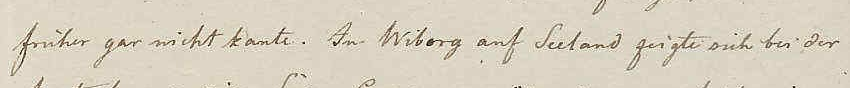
früher gar nicht kante. In Wiborg auf Seeland zeigte sich bei der
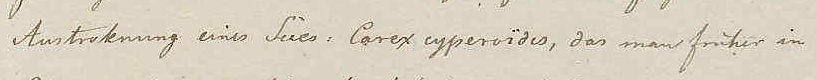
Austroknung eines Seees: Carex cyperoïdes, das man früher in
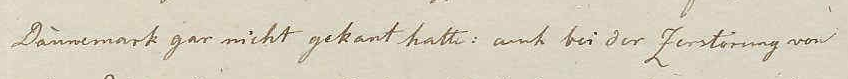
Dännemark gar nicht gekant hatte: auch bei der Zerstörung von
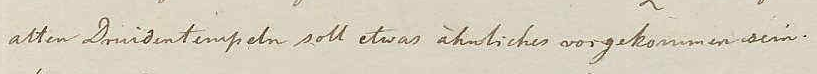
alten Druidentempeln soll etwas ähnliches vorgekommen sein.
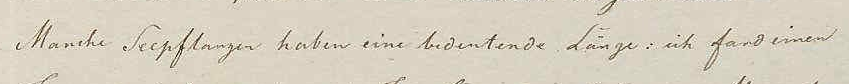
Manche Seepflanzen haben eine bedeutende Länge: ich fand einen
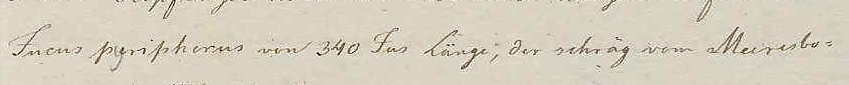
Fucus peyripherus von 340 Fus Länge, der schräg vom Meeresbo-
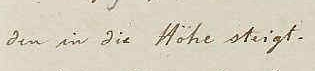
den in die Höhe steigt.
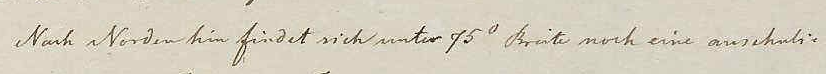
Nach Norden hin findet sich unter 75° Breite noch eine ansehnli-
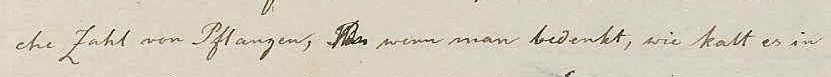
che Zahl von Pflanzen, Br wenn man bedenkt, wie kalt es in
